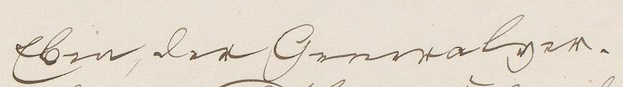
Eben, der Generalver-
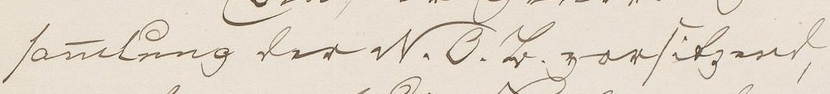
sammlung der N.O.B. vorsitzend,
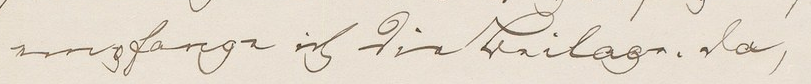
empfange ich die Beilage. Da,
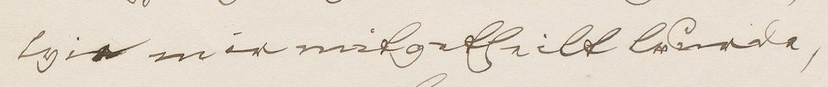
wie mir mitgetheilt wurde,
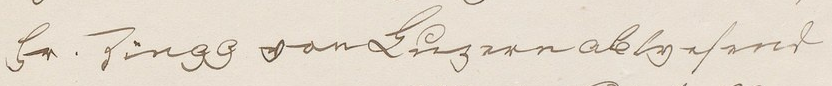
Hr. Zingg von Luzern abwesend
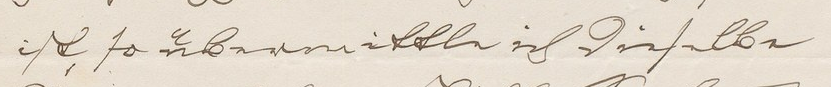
ist, so übermittle ich dieselbe
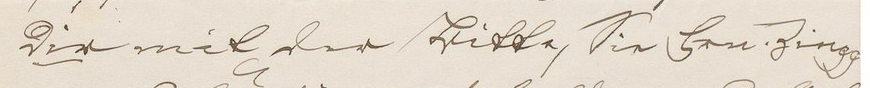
Dir mit der Bitte, Sie Hrn. Zingg
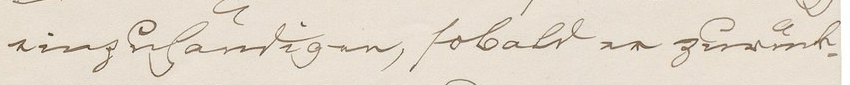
einzuhändigen, sobald er zurück-
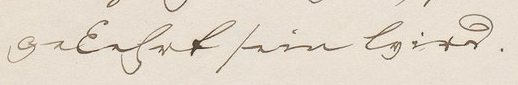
gekehrt sein wird.
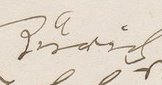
Zürich
